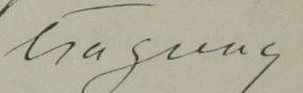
tragung
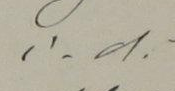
in d.
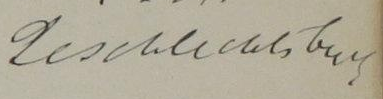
Geschlechtsbuch
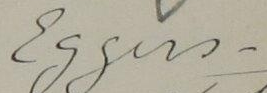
Eggers-
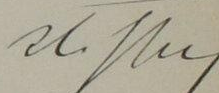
stiftung
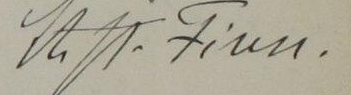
Stift Finn.
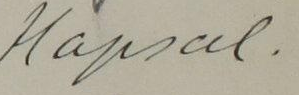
Hapsal.
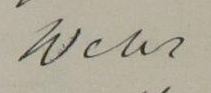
Wehr
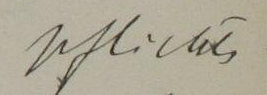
pflichts
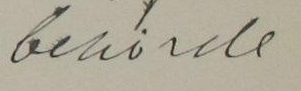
behörde
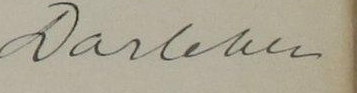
Darlehen
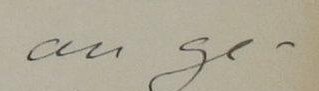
an ge-
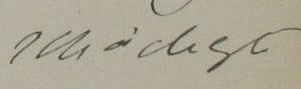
schädigt
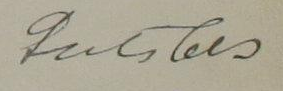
Gutsbes
